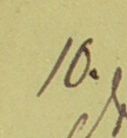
10
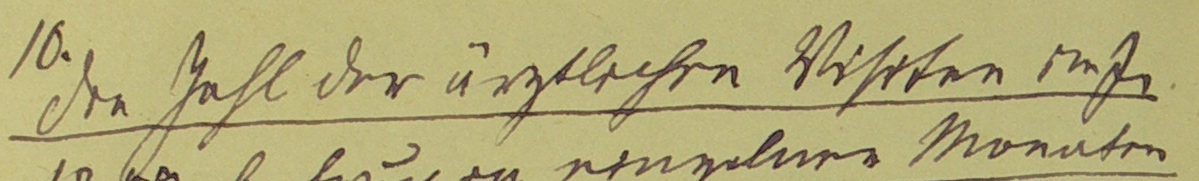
Die Zahl der ärztlichen Visiten im Jahr
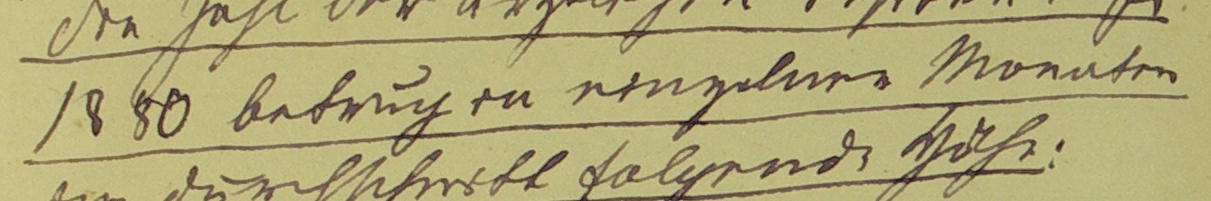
1880 betrug in einzelnen Monaten
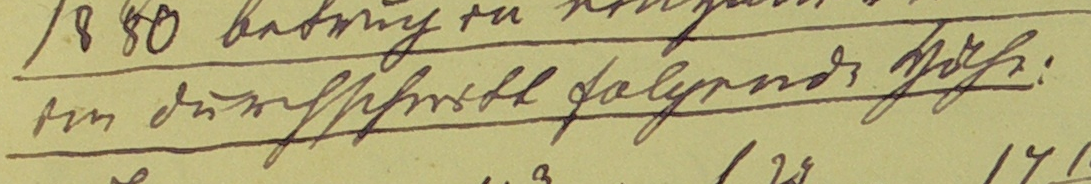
im Durchschnitt folgende Höhe:
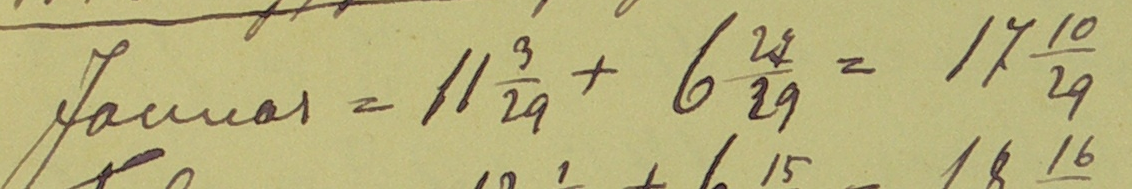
Januar = 11 3/29 + 6 27/29 = 17 10/29
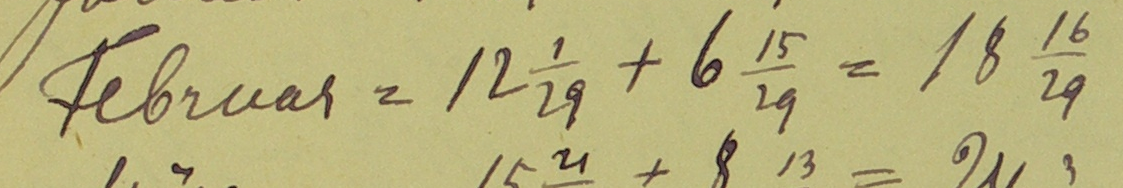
Februar = 12 1/29 + 6 15/29 = 18 16/29
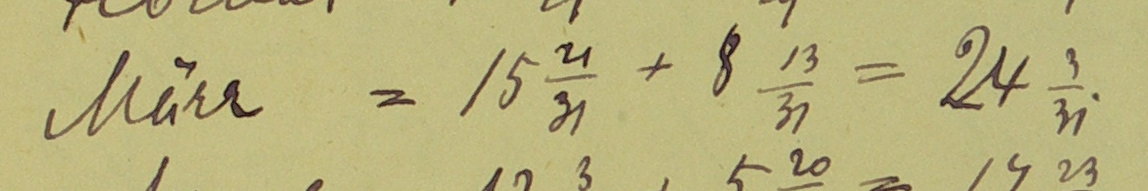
März = 15 21/31 + 8 13/31 = 24 3/31
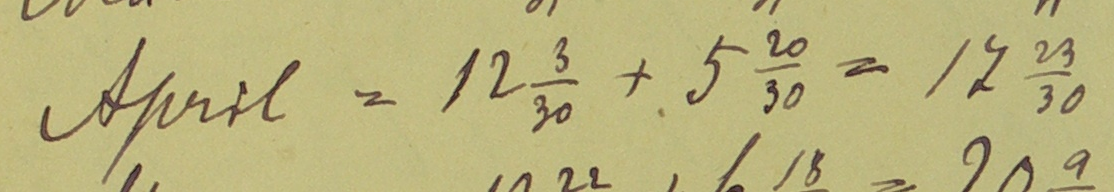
April = 12 20/30 + 5 20/30 = 17 23/30
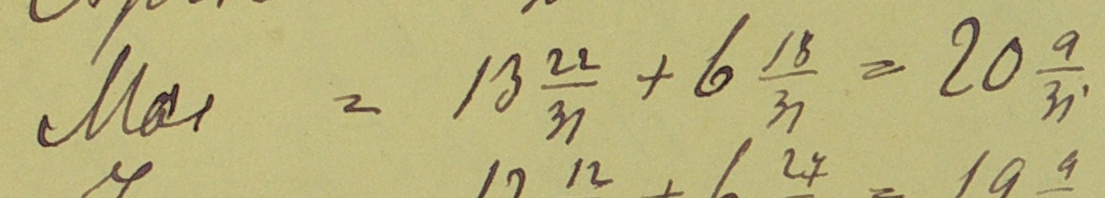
Mai = 13 22/31 + 6 18/31 = 20 9/31
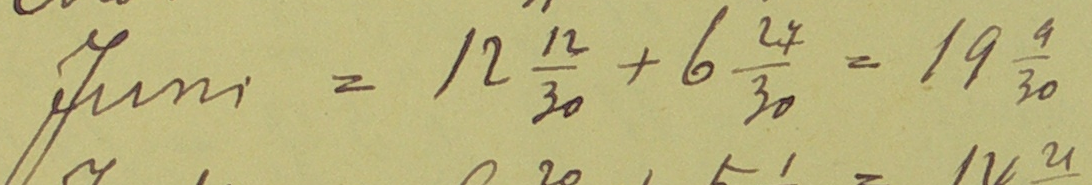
Juni = 12 12/30 + 6 27/30 = 19 4/30
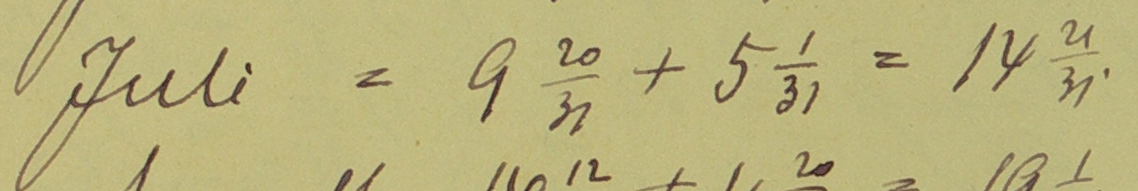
Juli = 9 20/31 + 5 1/31 = 14 21/31
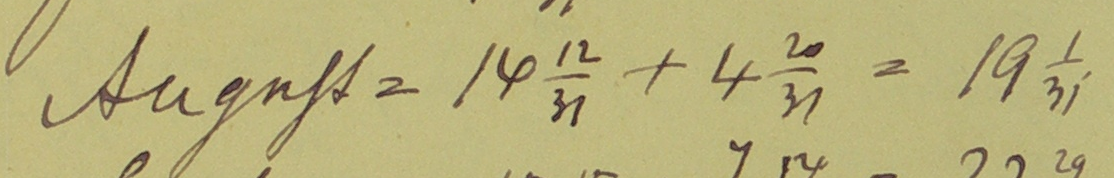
August = 14 12/31 + 4 20/31 = 19 1/31
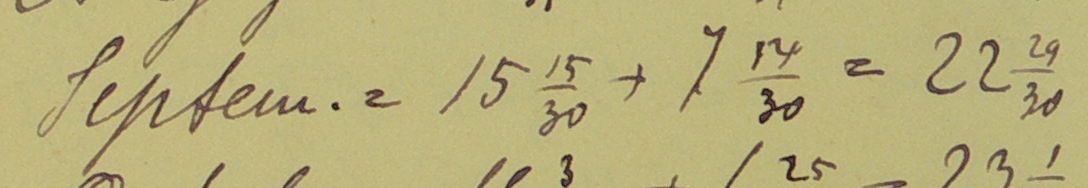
Septem. = 15 15/30 + 7 14/30 = 22 29/30
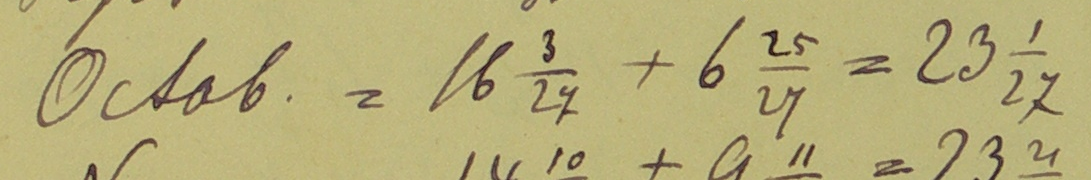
Octob. = 16 3/27 + 6 25/27 = 23 1/27
